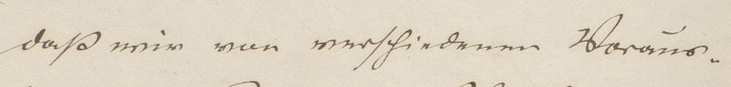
daß wir von verschiedenen Voraus-
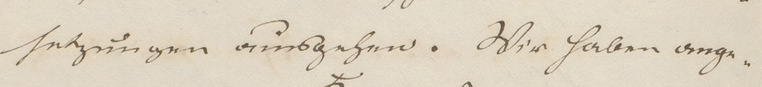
setzungen ausgehen. Wir haben ange-
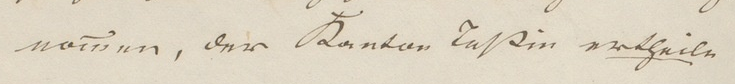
nommen, der Kanton Teßinertheile
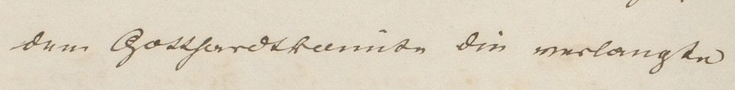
dem Gotthardtkomite die verlangte
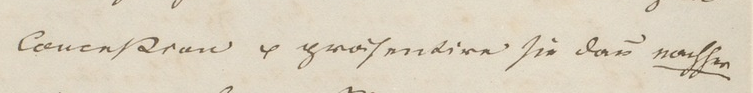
Conceßion & präsentire sie dann nachher
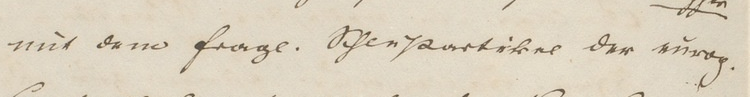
mit dem fragl. Schlußartikel der europ.
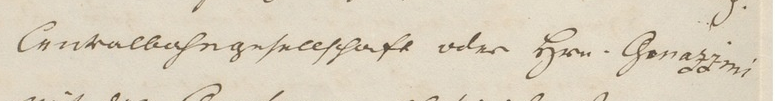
Centralbahngesellschaft oder Hrn. Genazzini
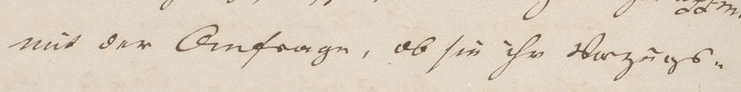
mit der Anfrage, ob sie ihr Vorzugs-
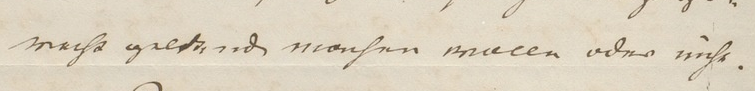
recht geltend machen wolle oder nicht.
